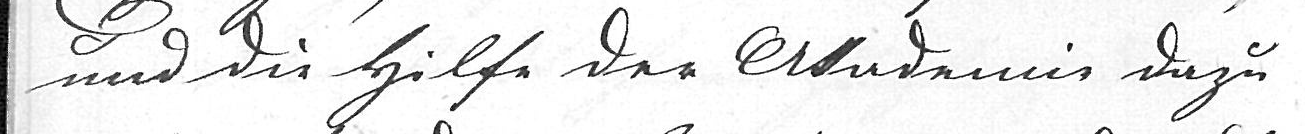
und die Hilfe der Akademie dazu
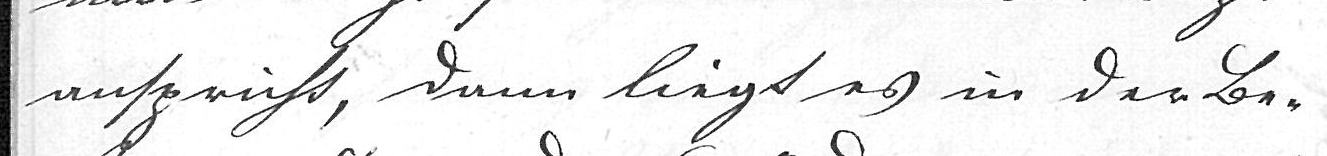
anspricht, dann liegt es in der Be-
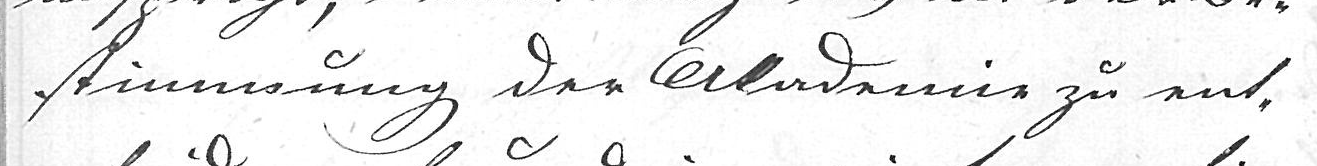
stimmung der Akademie zu ent-
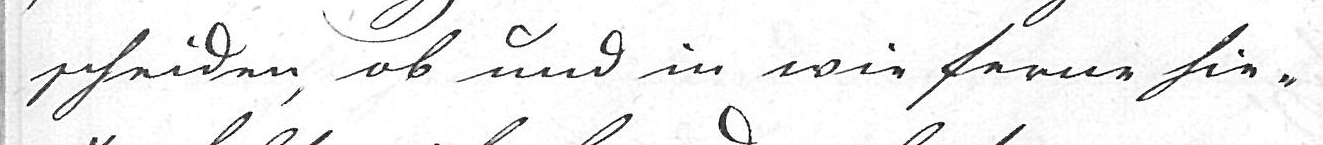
scheiden, ob und in wie ferne hie-
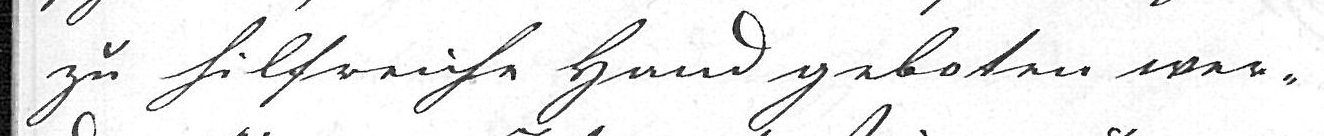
zu hilfreiche Hand geboten wer-
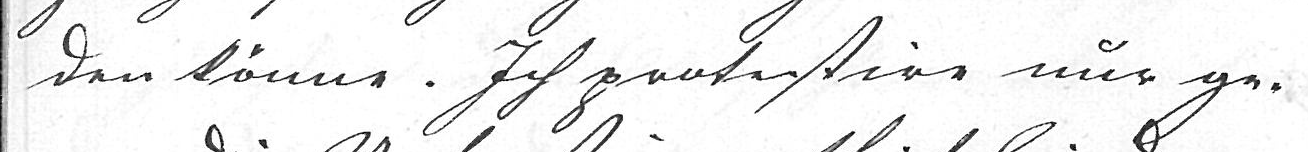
den könne. Ich protestirt nur ge-
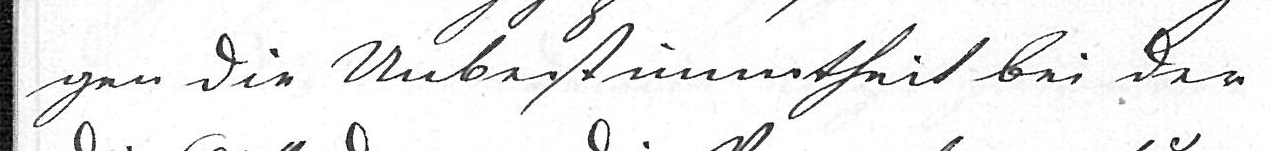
gen die Unbestimmtheit bei der
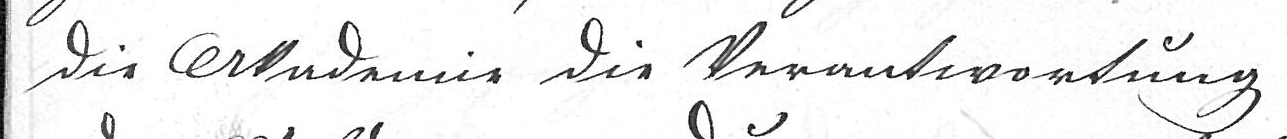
die Akademie die Verantwortung
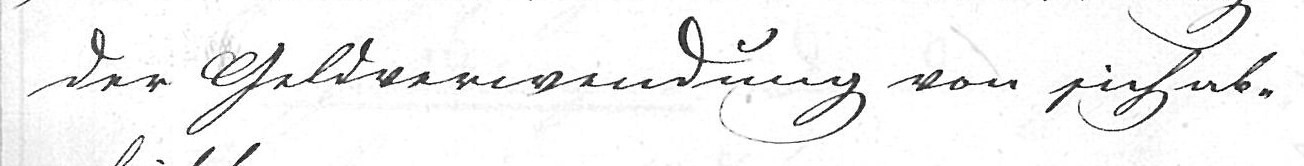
der Geldverwendung von sich ab-
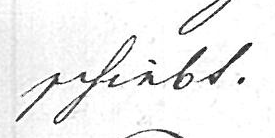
schiebt.
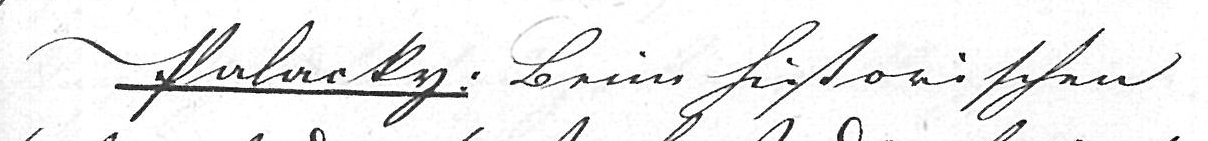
Palacky: Beim historischen
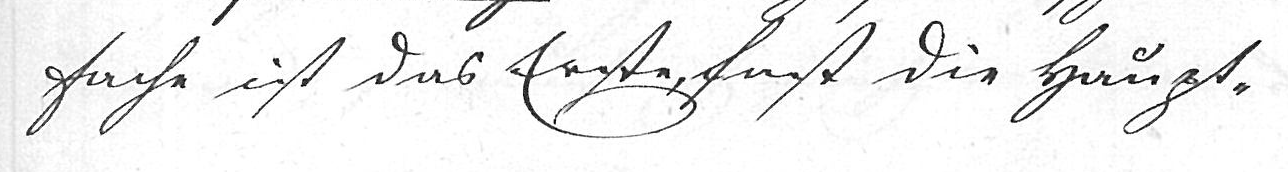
Fach ist das Erste, fast die Haupt-
